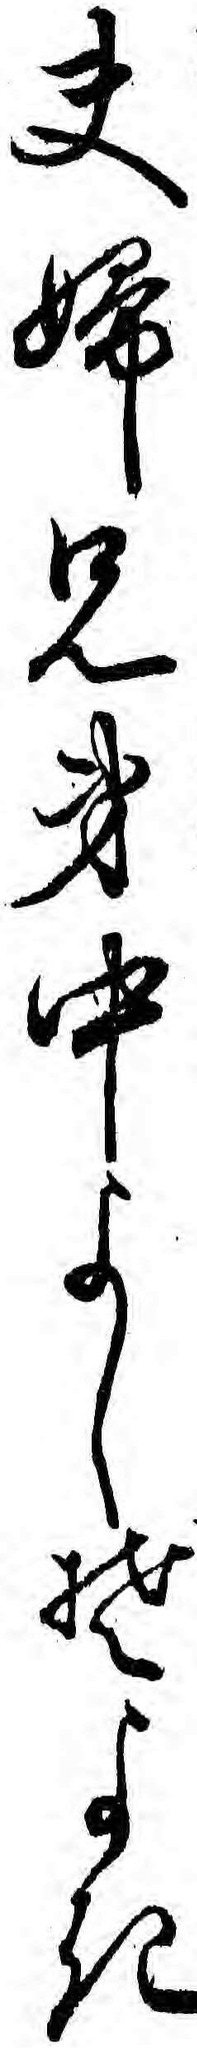夫婦兄弟中よしぞよき
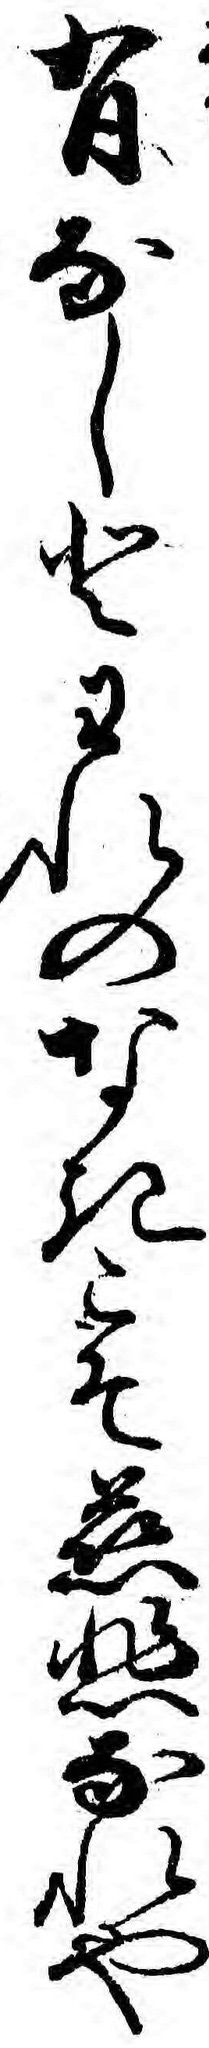有なしとわれのなきこそ慈悲なれや
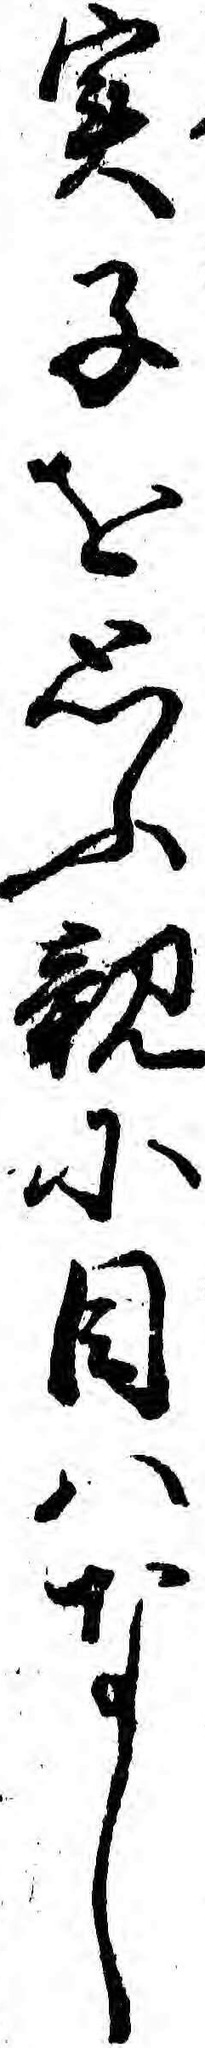実子を思ふ親に目はなし

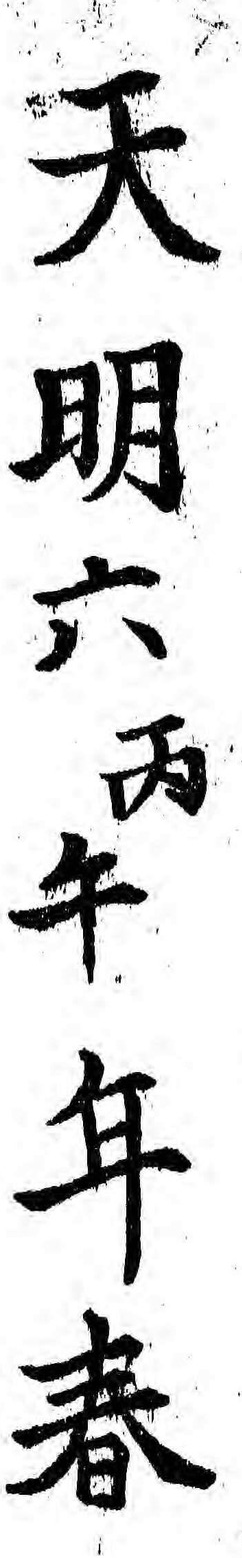天明六丙午年春
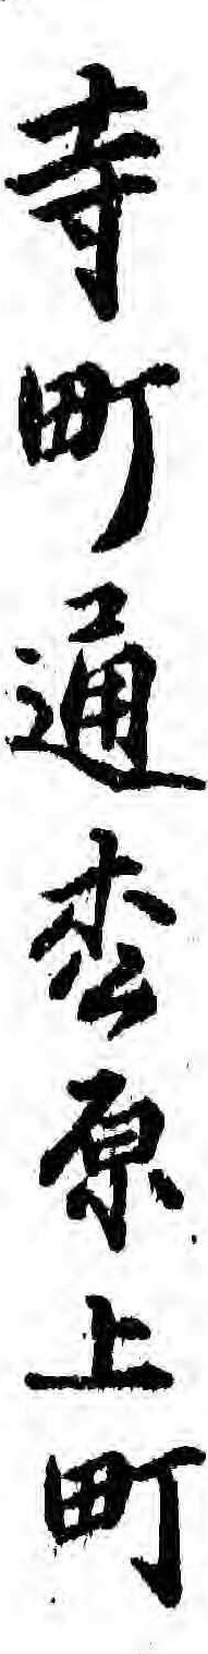寺町通松原上町
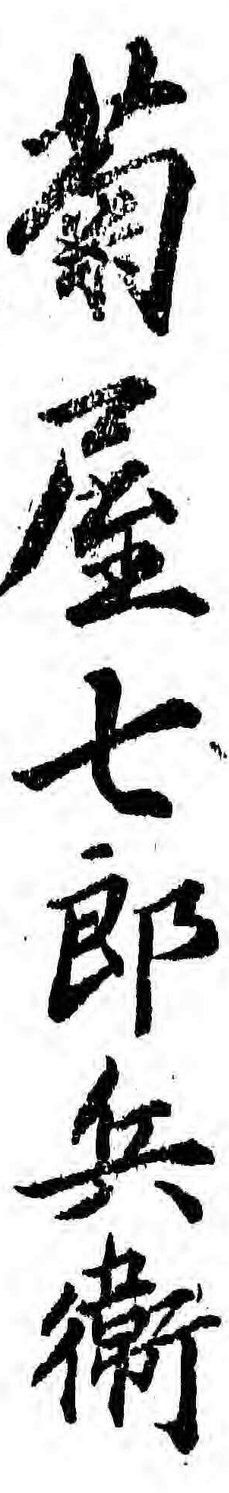菊屋七郎兵衛
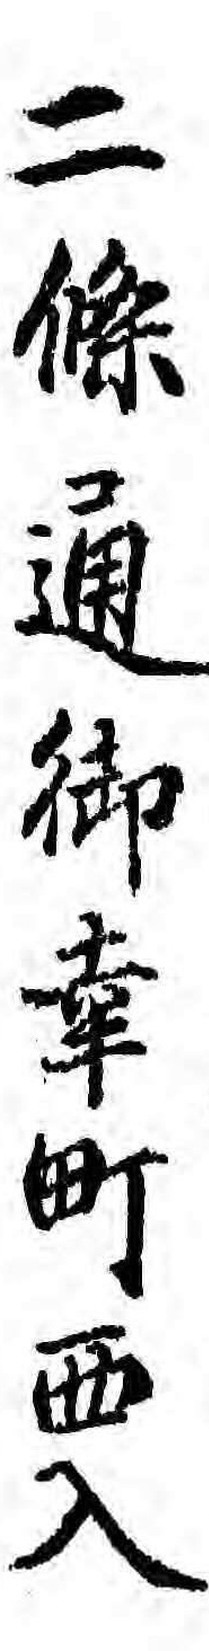二条通御幸町西入
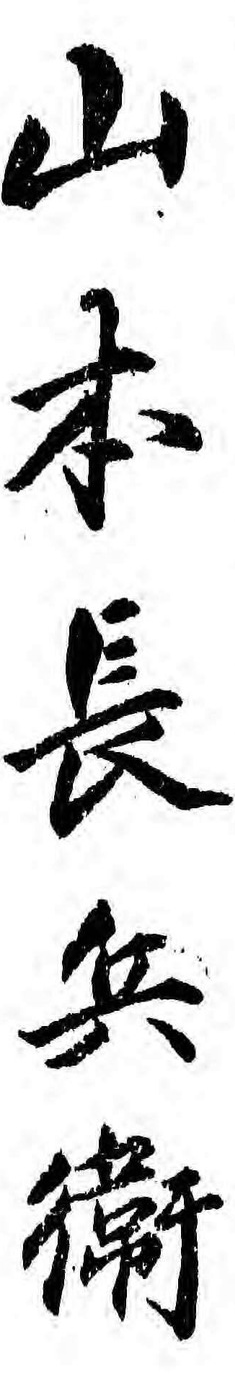山本長兵衛
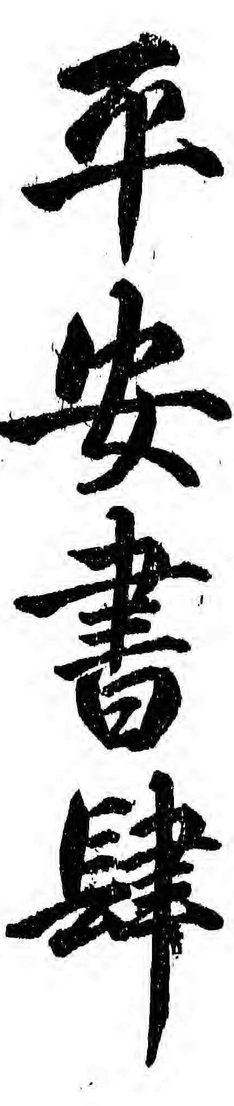平安書肆
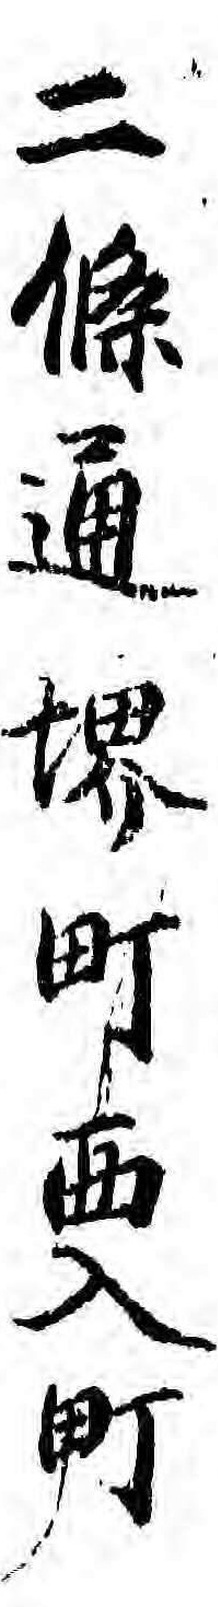二条通境町西入町
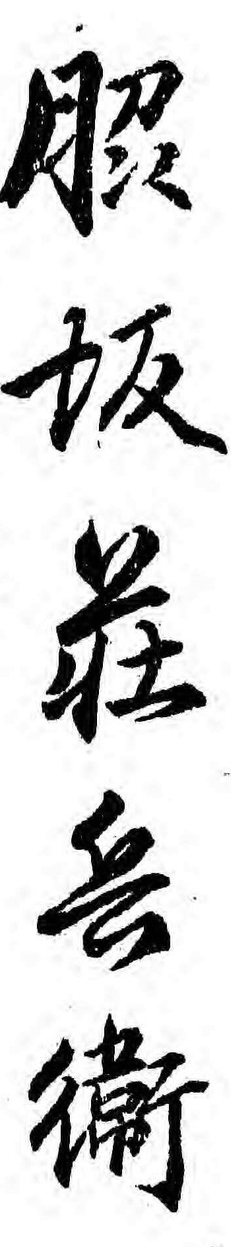脇坂荘兵衛
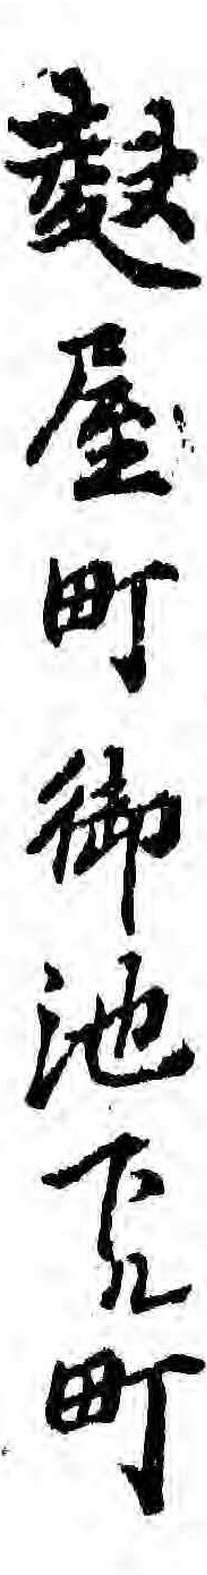麩屋町御池下ル町
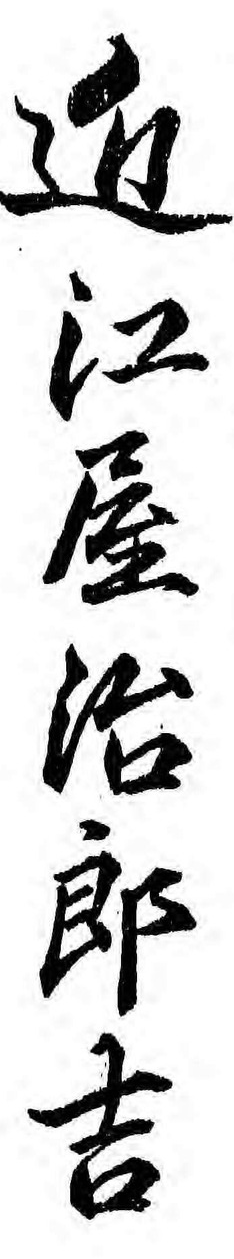近江屋治郎吉
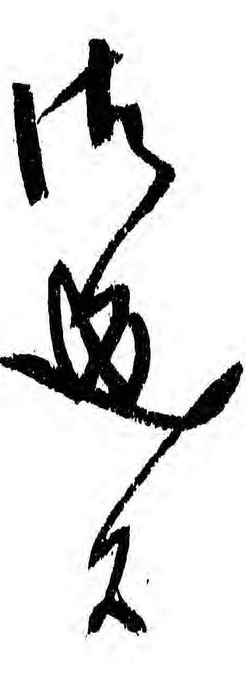御返候
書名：目なし用心抄
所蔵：国文学研究資料館
